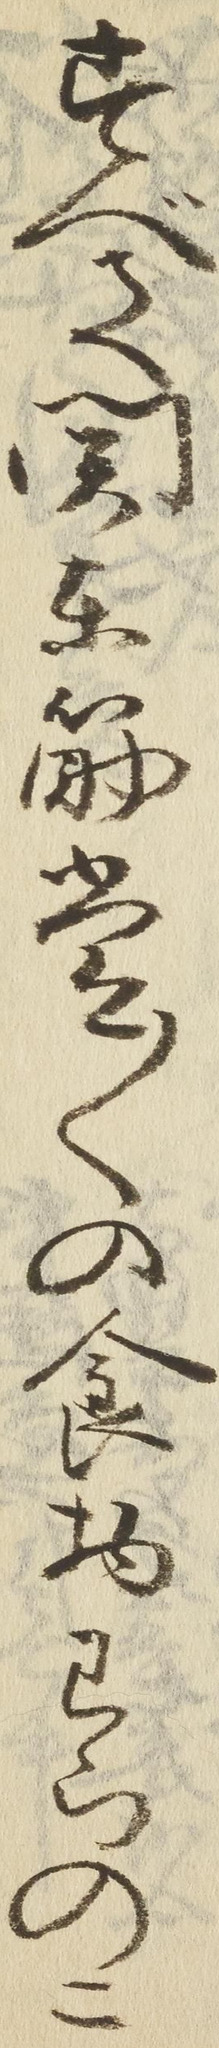すべて関東筋常々の食物わらのこ
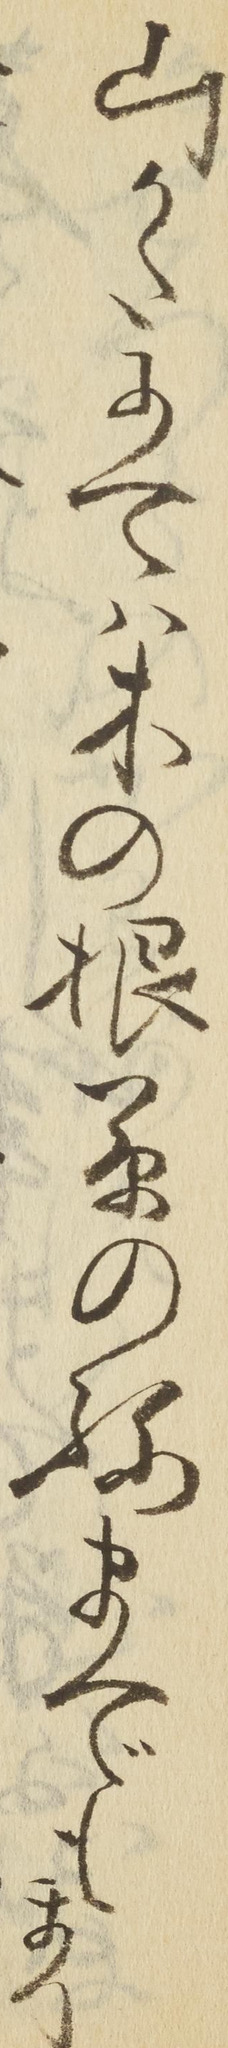山かたにては木の根草のねまでもほり
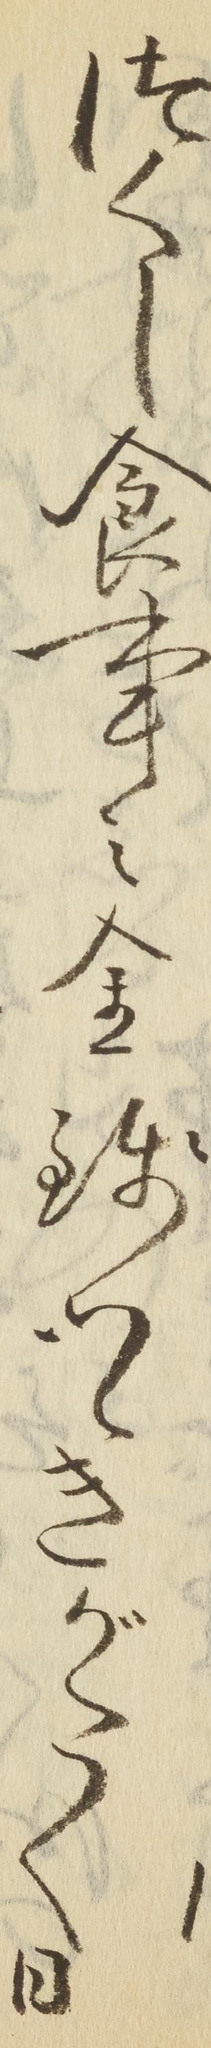つくし食事之金銭つゝきがたく日
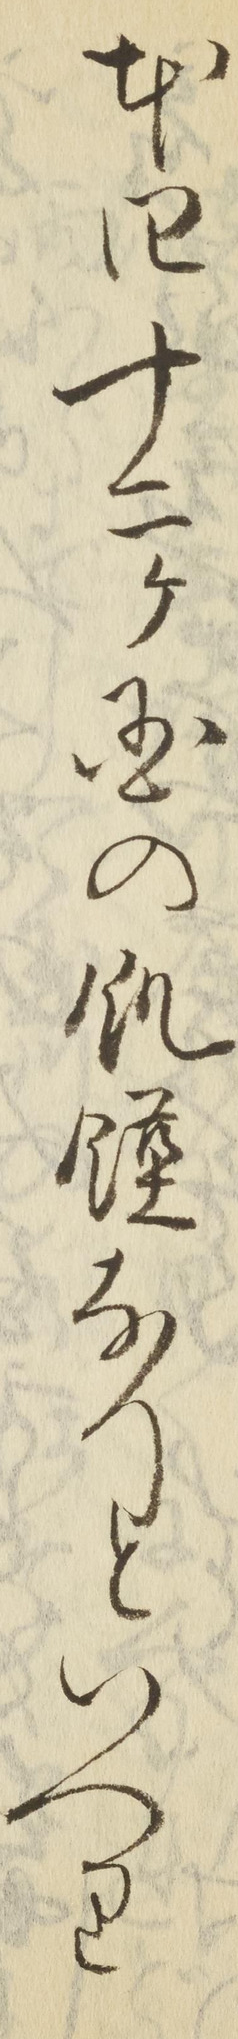本四十二ヶ国の飢饉なりといへり

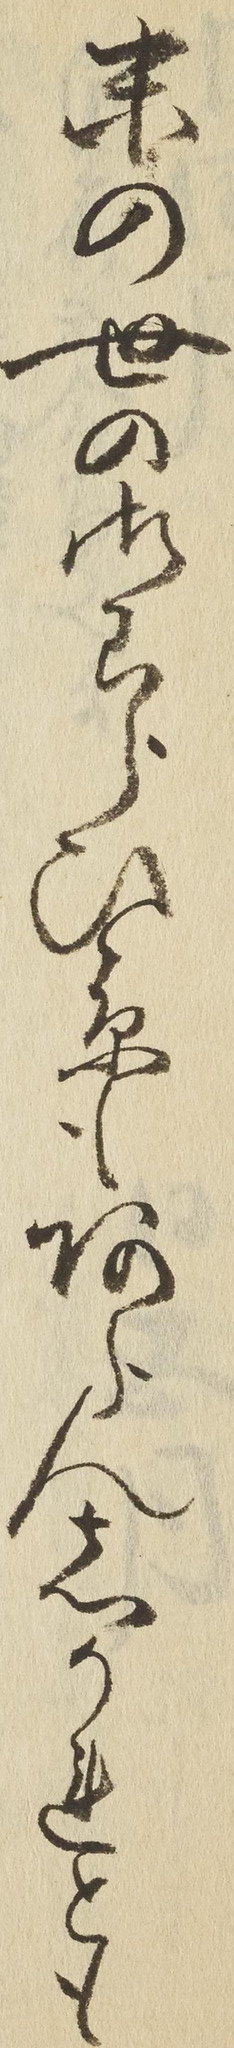末の世の御わらひしもあらんしかれとも
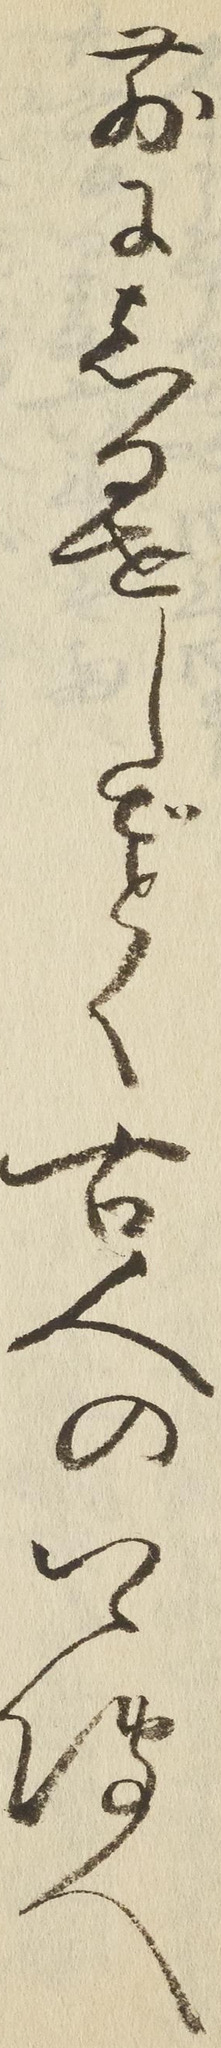前にするけしごとく古人のいゝ伝へ
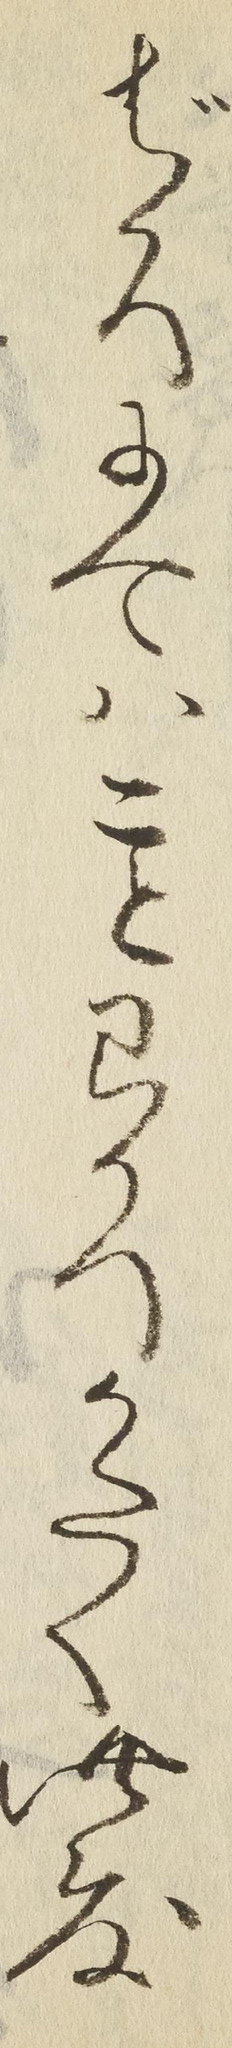ばかりにてはことわかりかたく此度
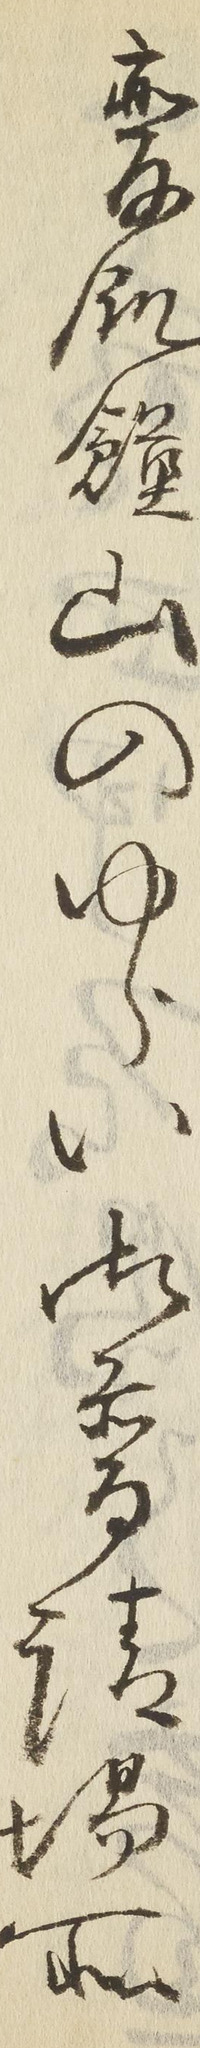変飢饉山のゆらい御普請場所
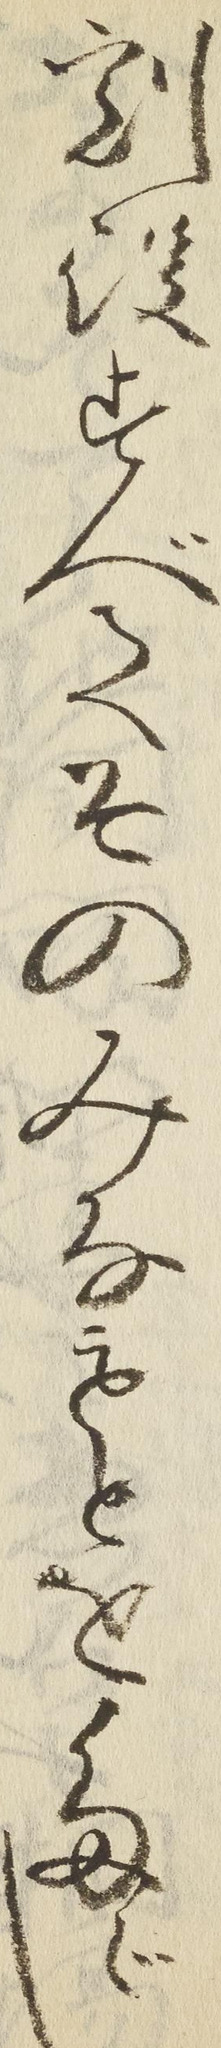割役すべてそのみなもとと而をただし
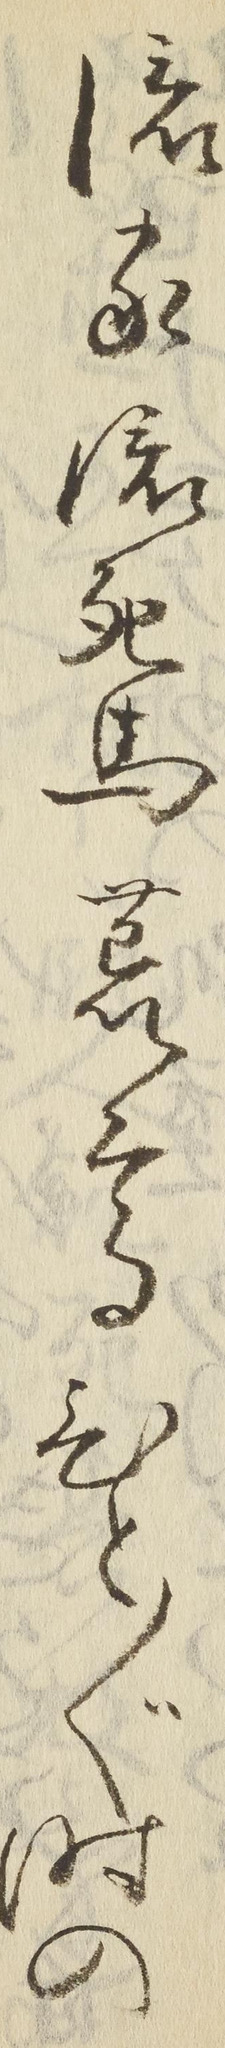流家流死馬荒高ひと〴〵時の
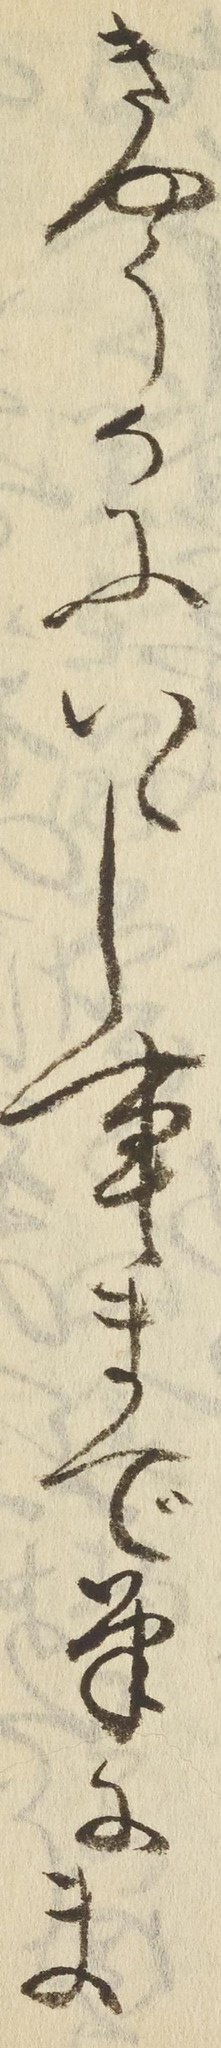きゆかにいたし事まで筆にま
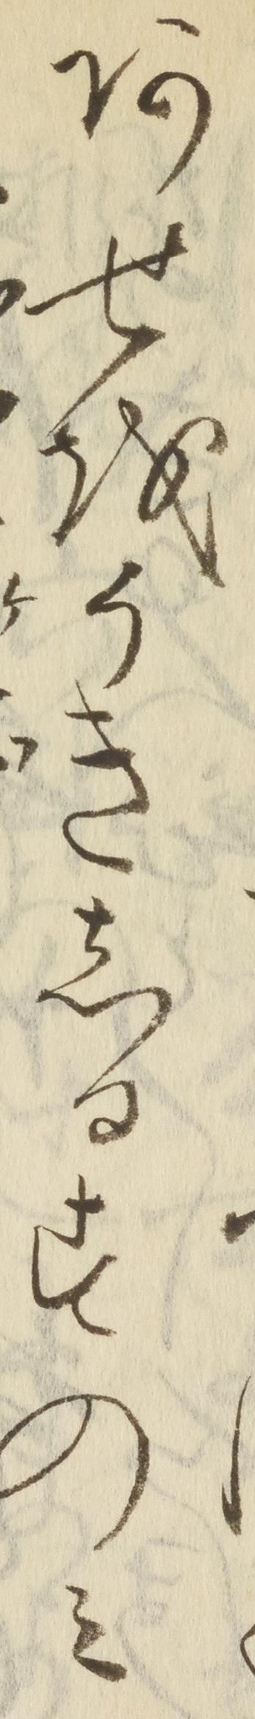あせをかきしるすのみ
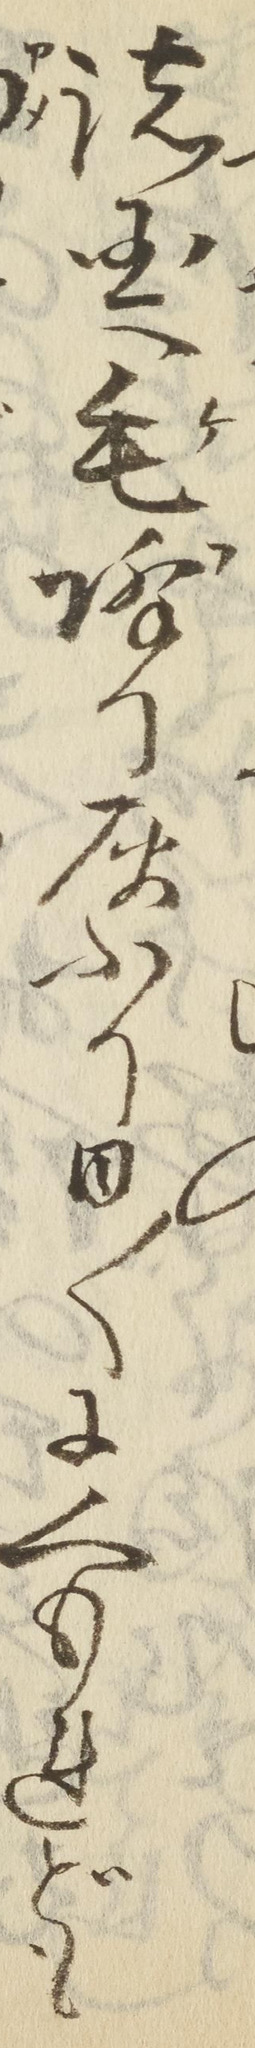諸国へ毛降灰ふり日々くもれども
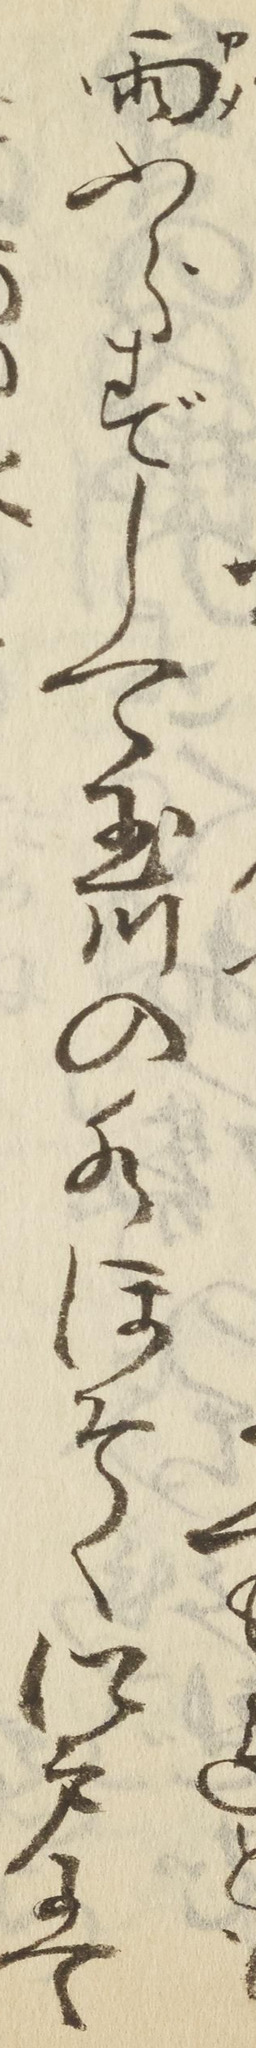雨ふらずして玉川の水ほそく江戸にて
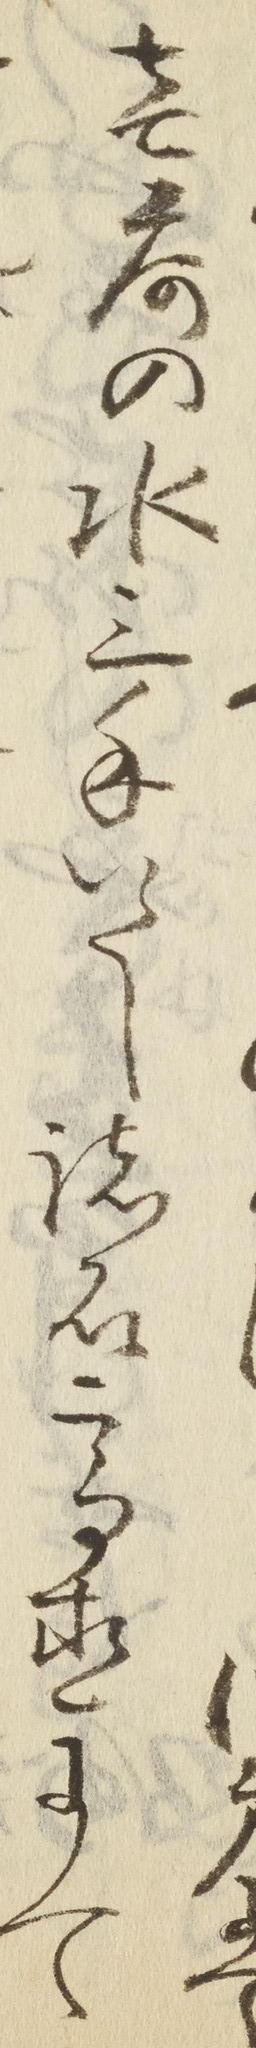壱荷の水三年いたし諸石二而高直にて
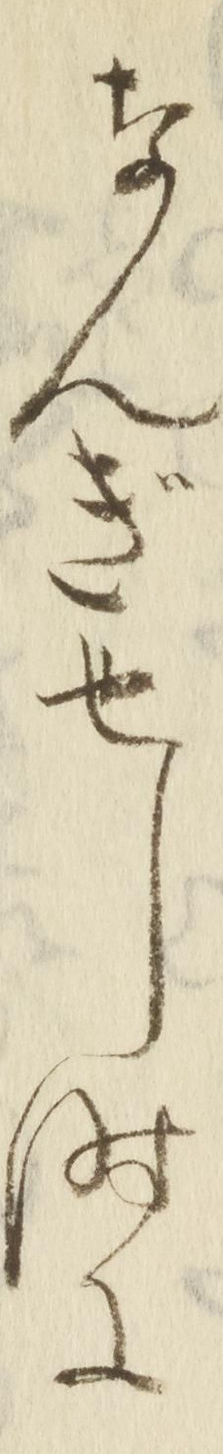なんぎせし時に
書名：浅間大變記
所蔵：東京大学地震研究所図書室 Earthquake Research Institute Library, The University of Tokyo, JAPAN
